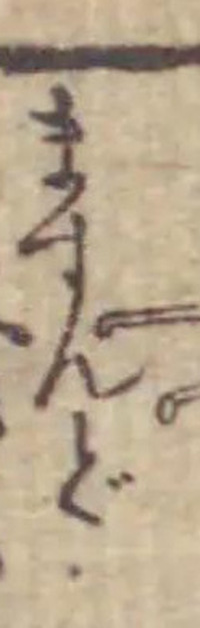ますんど
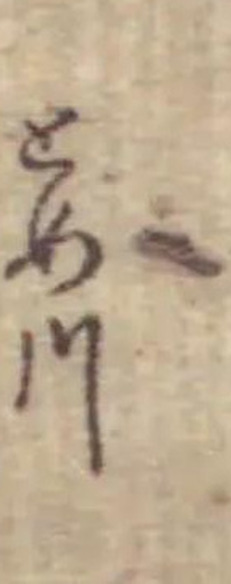とめ川
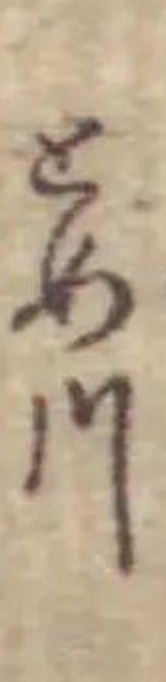とめ川
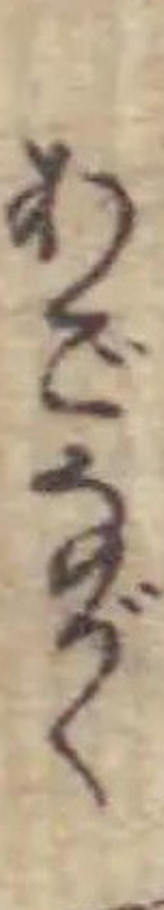あごながく
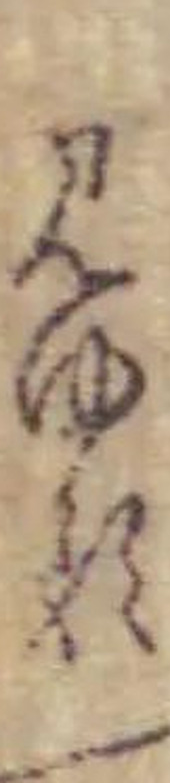見ゆる

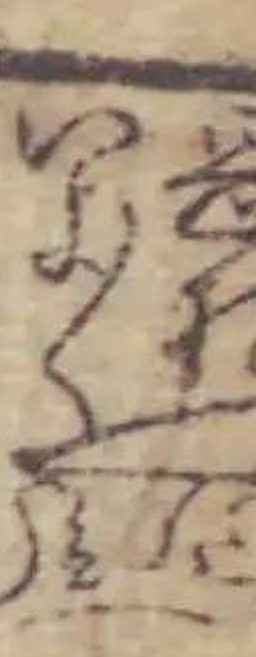いよ〳〵
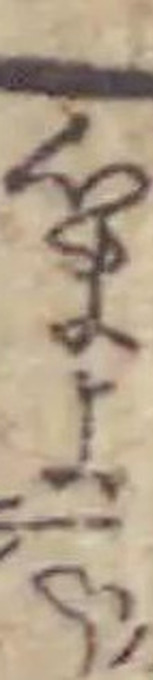心まよ
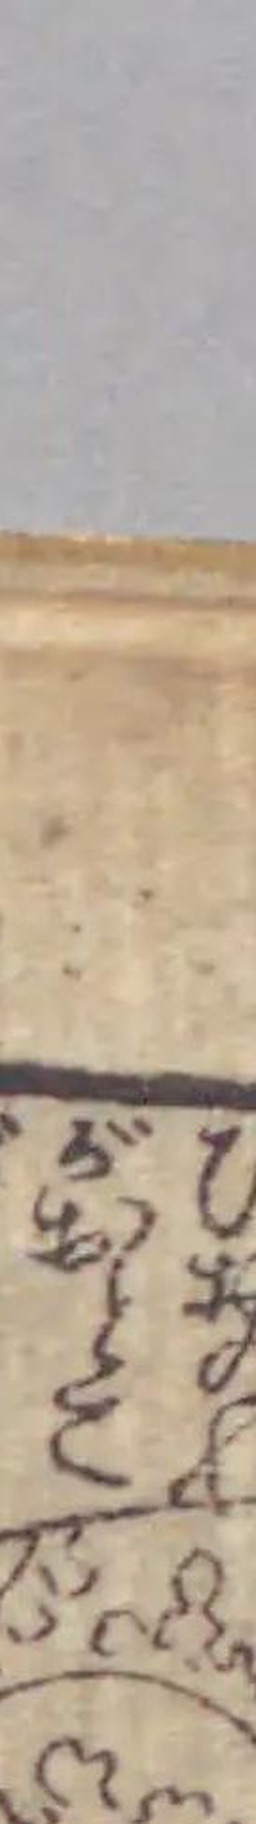がおとこ
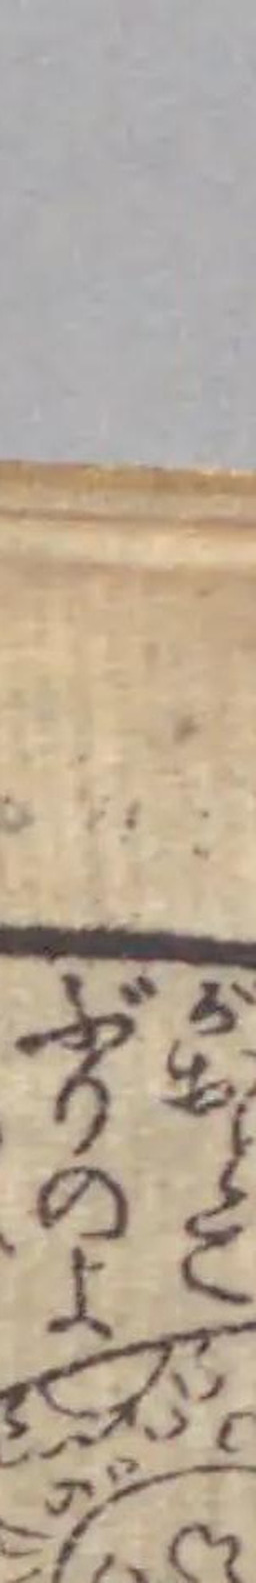ぶりのよ
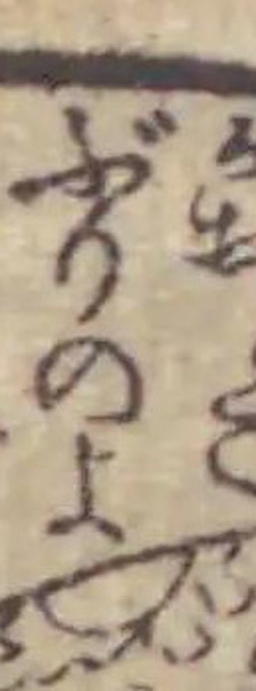ぶりのよ
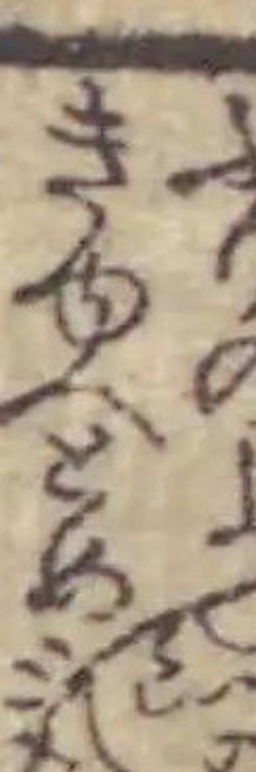きゆへとめ
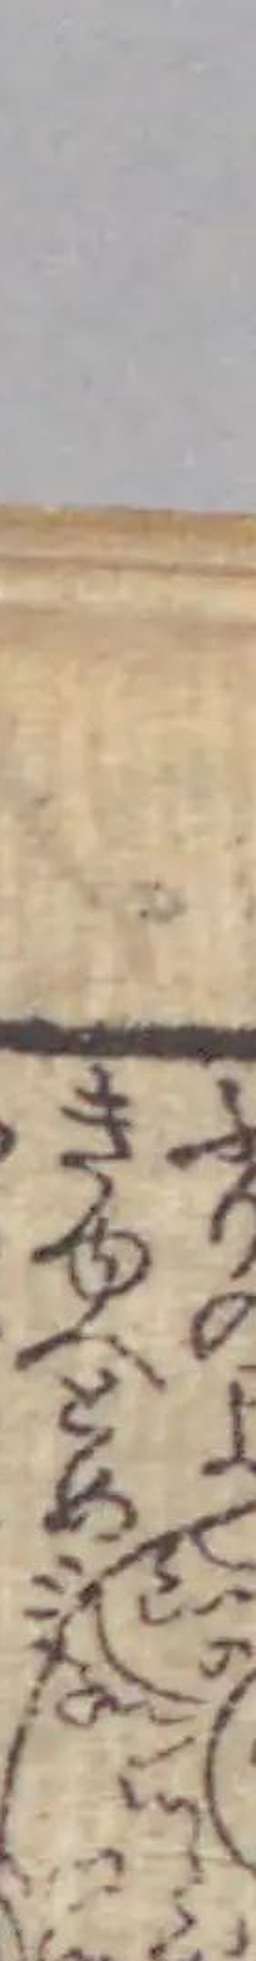きゆへとめ
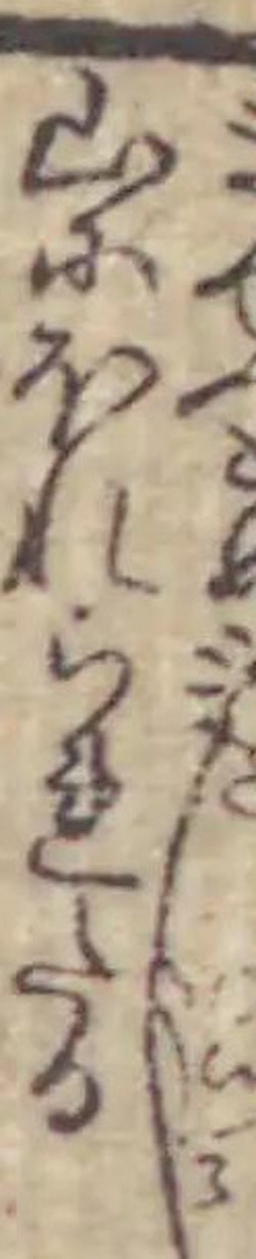山にほれられたる
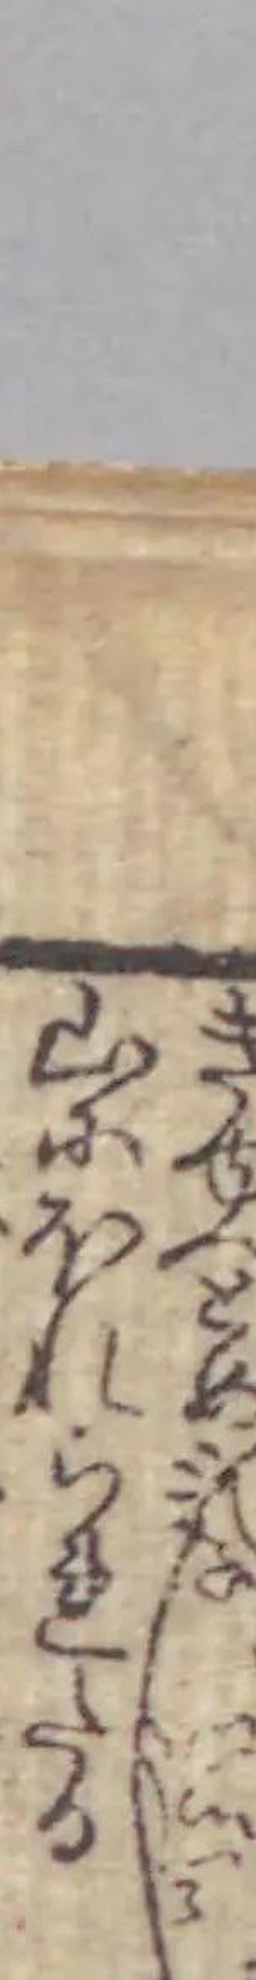山にほれられたる
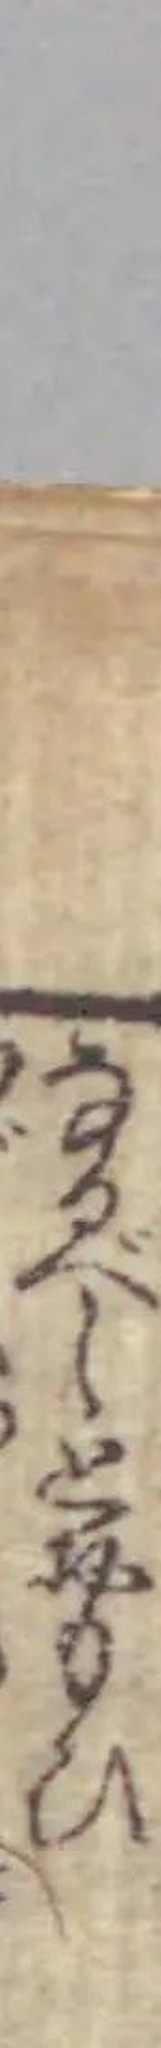なるべしとおもひ
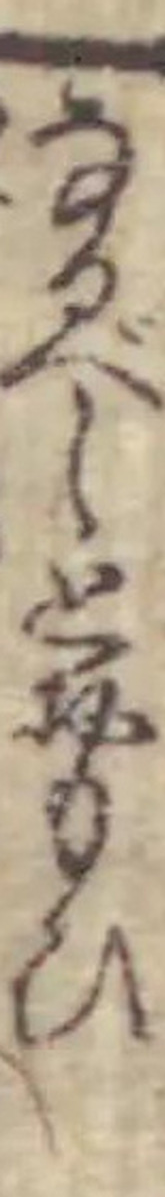なるべしとおもひ
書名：亀山人家妖 3巻
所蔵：国立国会図書館 National Diet Library, JAPAN
